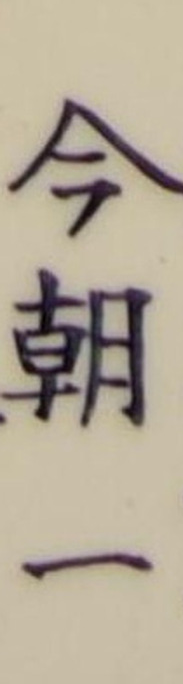今朝一
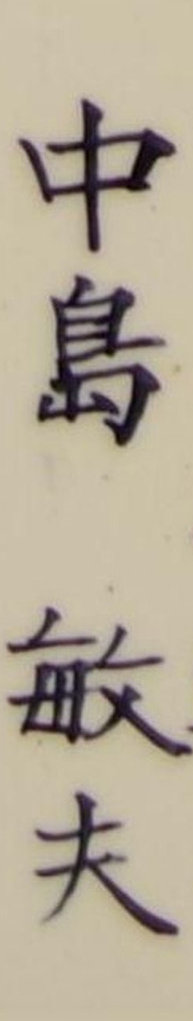中島敏夫
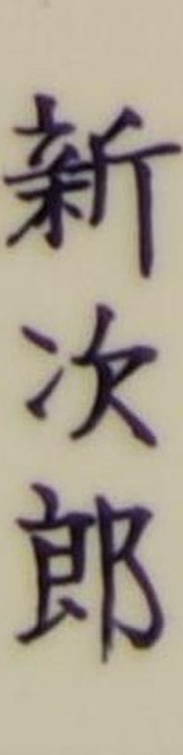新次郎
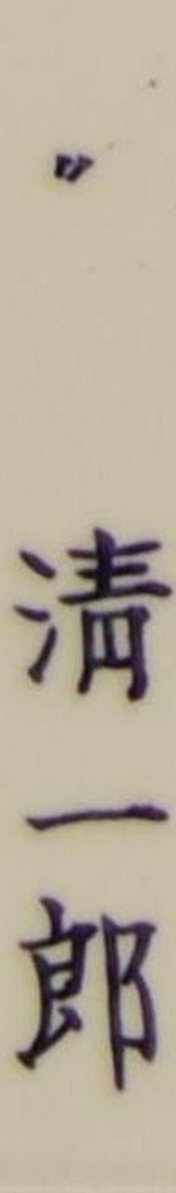清一郎
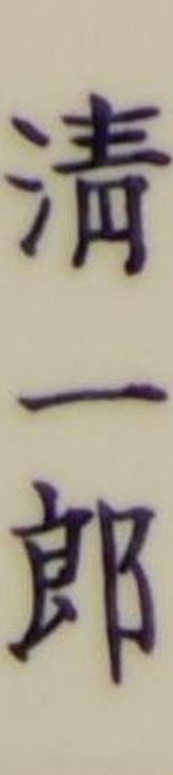清一郎
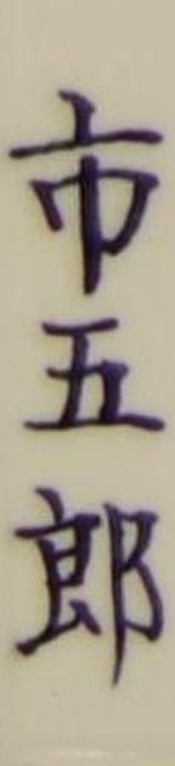市五郎

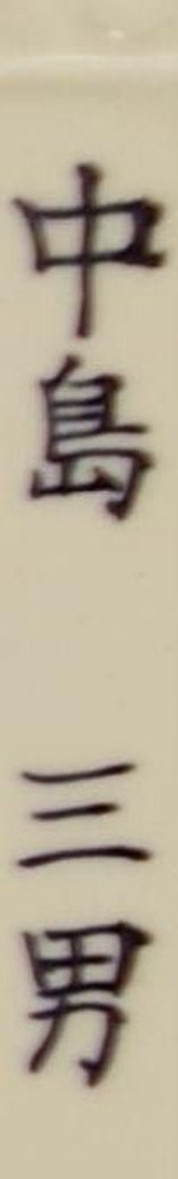中島三男
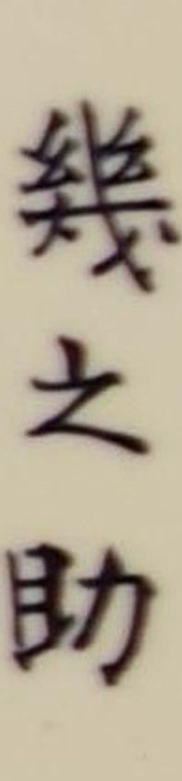幾之助
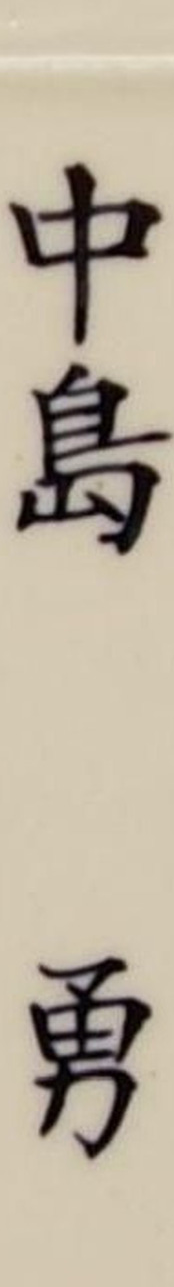中島勇
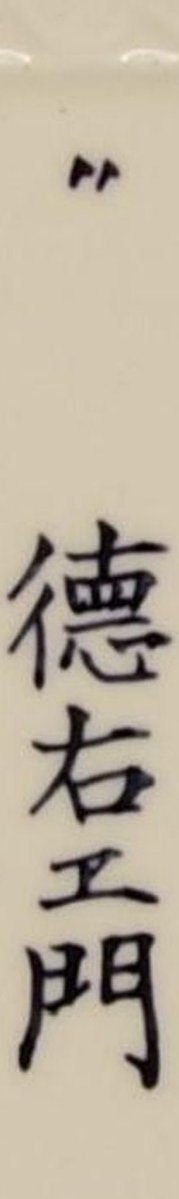徳右エ門
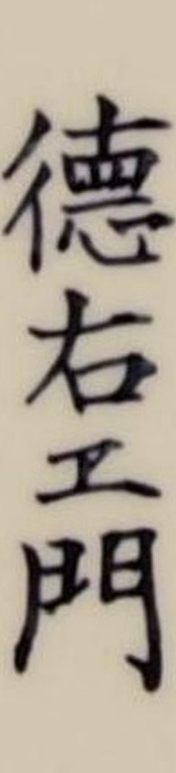徳右エ門
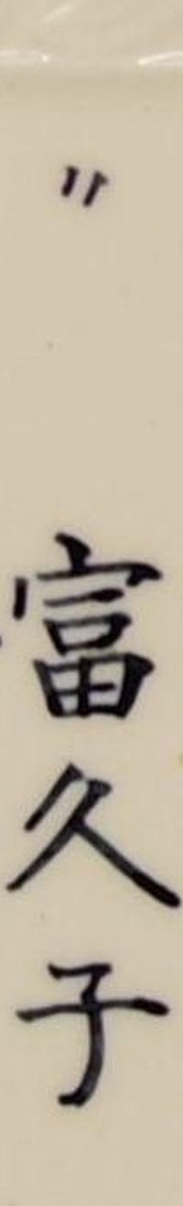富久子
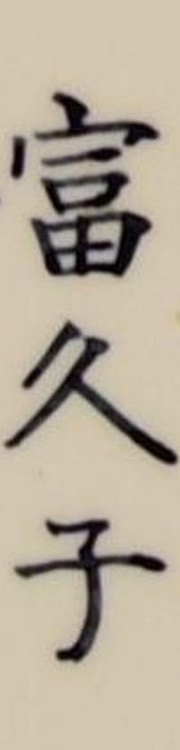富久子
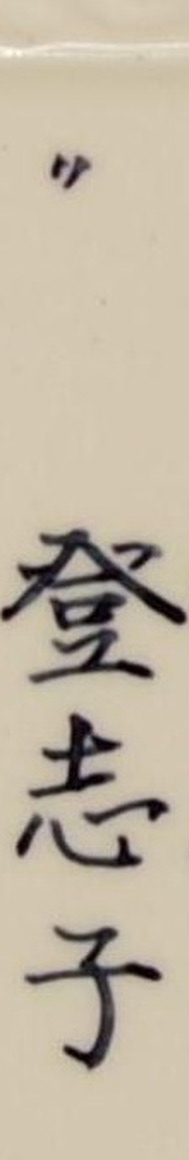登志子
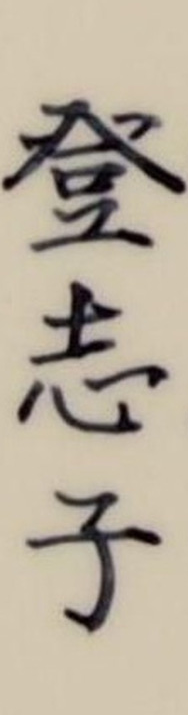登志子
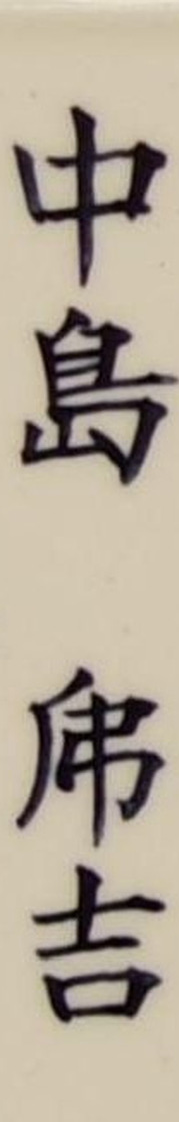中島虎吉
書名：A~D
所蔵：koyasan kongobuji
